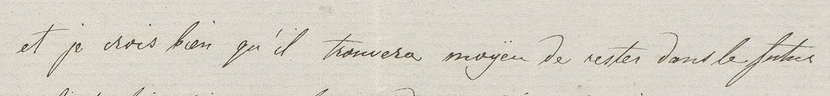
et je crois bien qu'il trouvera moyen de rester dans le futur
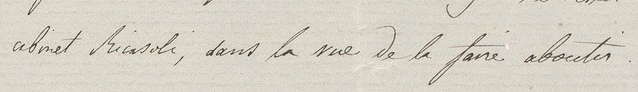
cabinet Ricasoli, dans la vue de la faire aboutir.
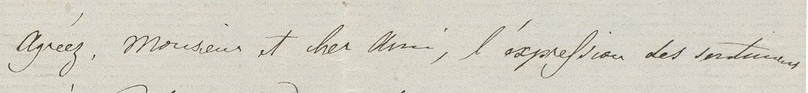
Agréez, Monsieur et cher Ami, l'expression des sentimens
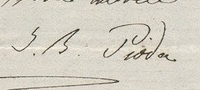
J. B. Pioda
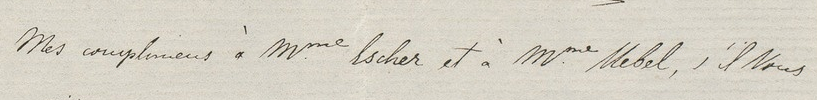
Mes complimens à MmeEscher et à MmeUebel, s'il Vous
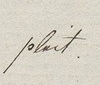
plait.
